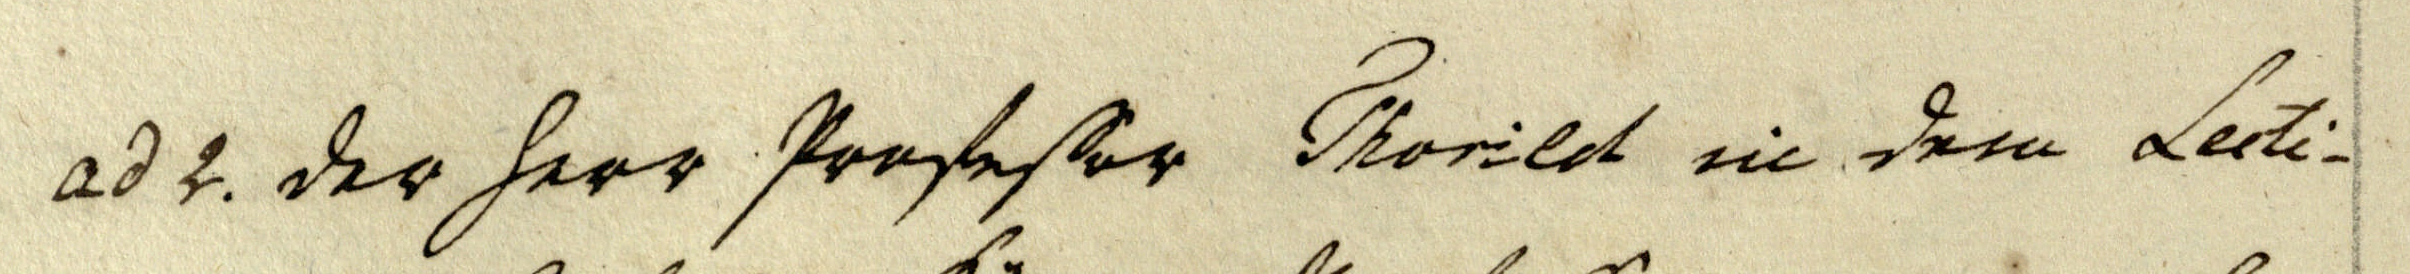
ad 2. der Herr Professor Thorild in dem Lecti¬
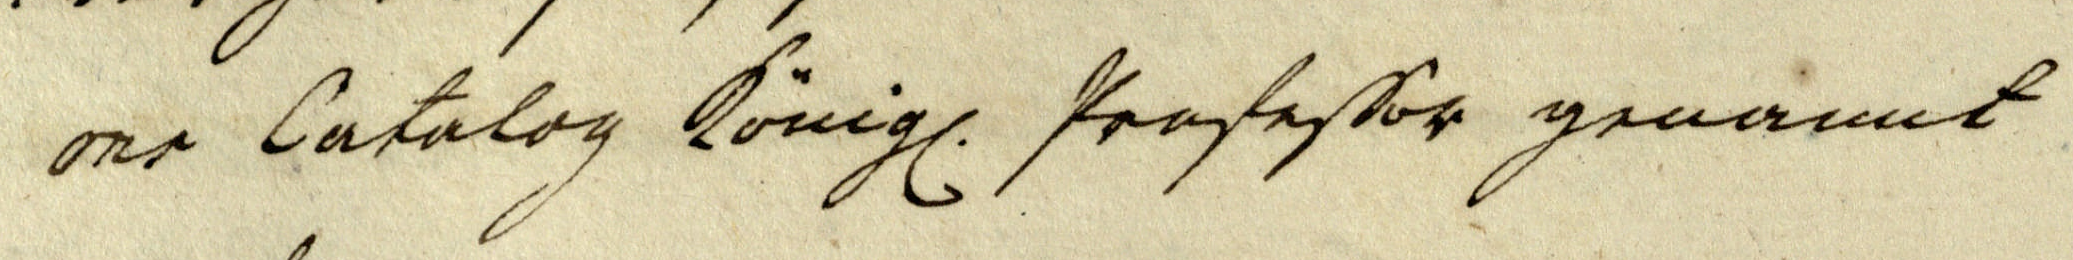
ons Catalog Königl. Professor genannt
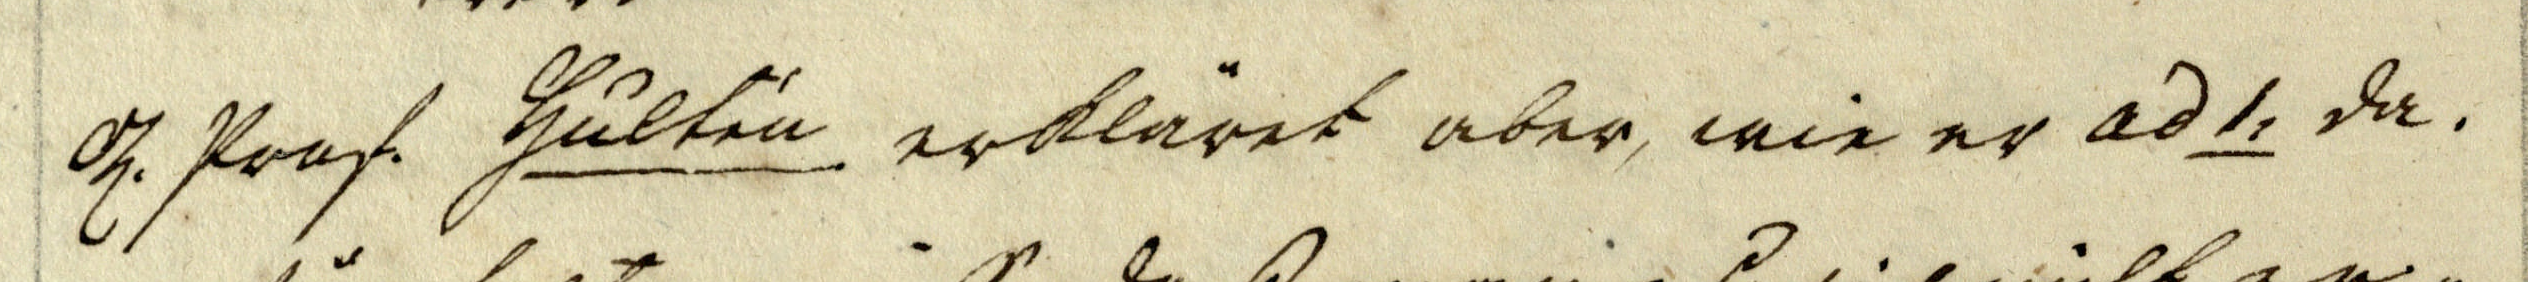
dh. Prof. Hultén erkläret aber, wie er ad 1. da¬
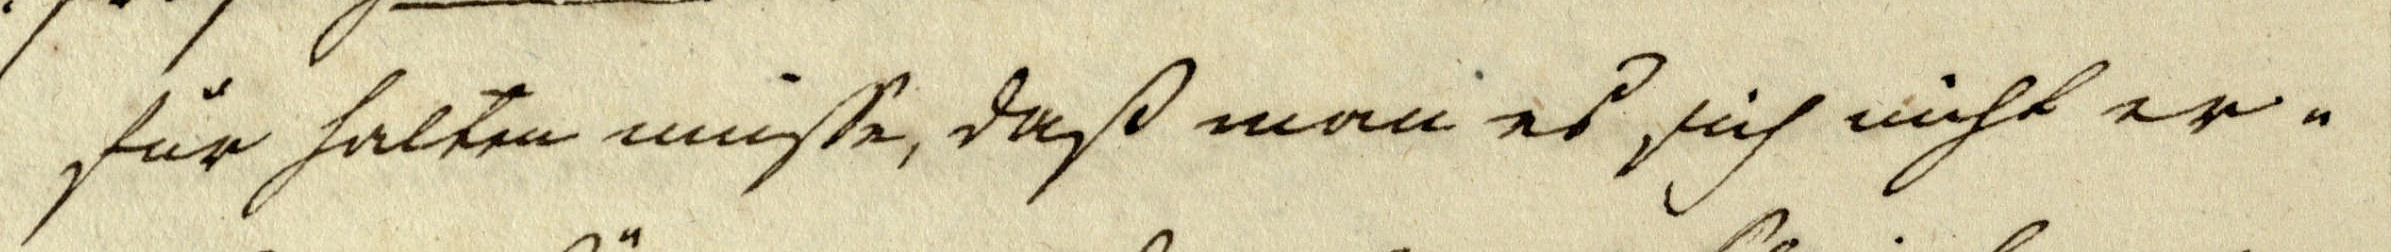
für halten müsse, daß man es sich nicht er¬
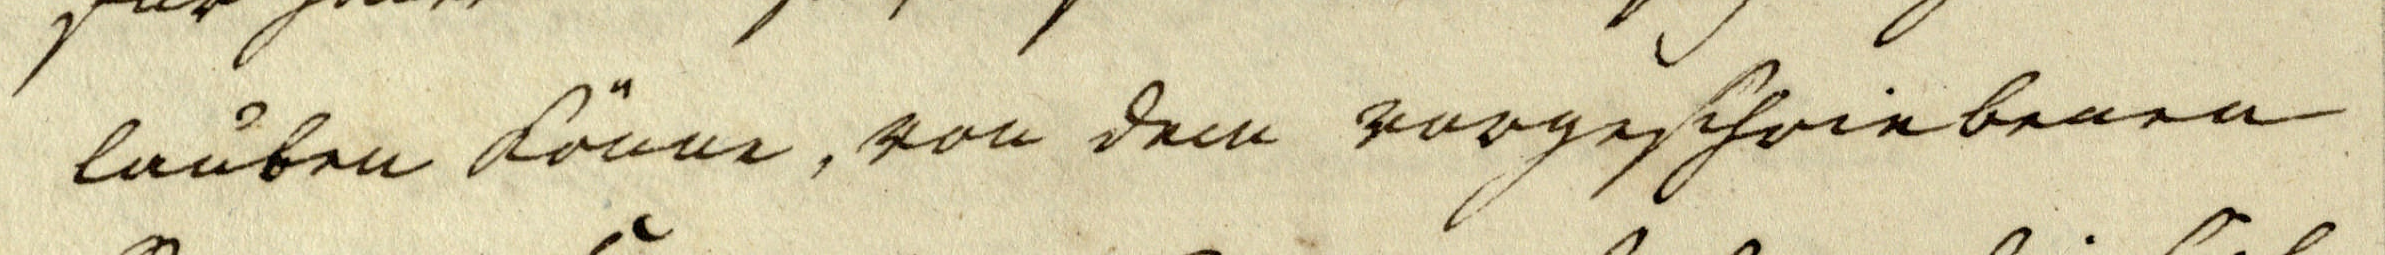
lauben könne, von dem vorgeschriebenen
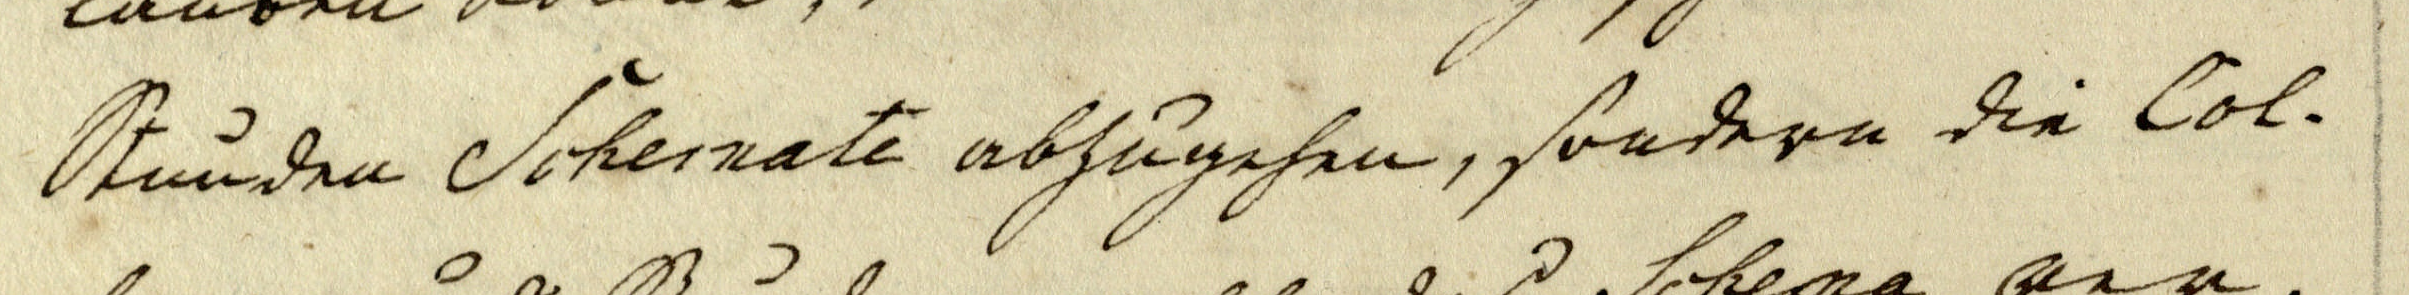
Stunden Schemate abzugehen, sondern die Col¬
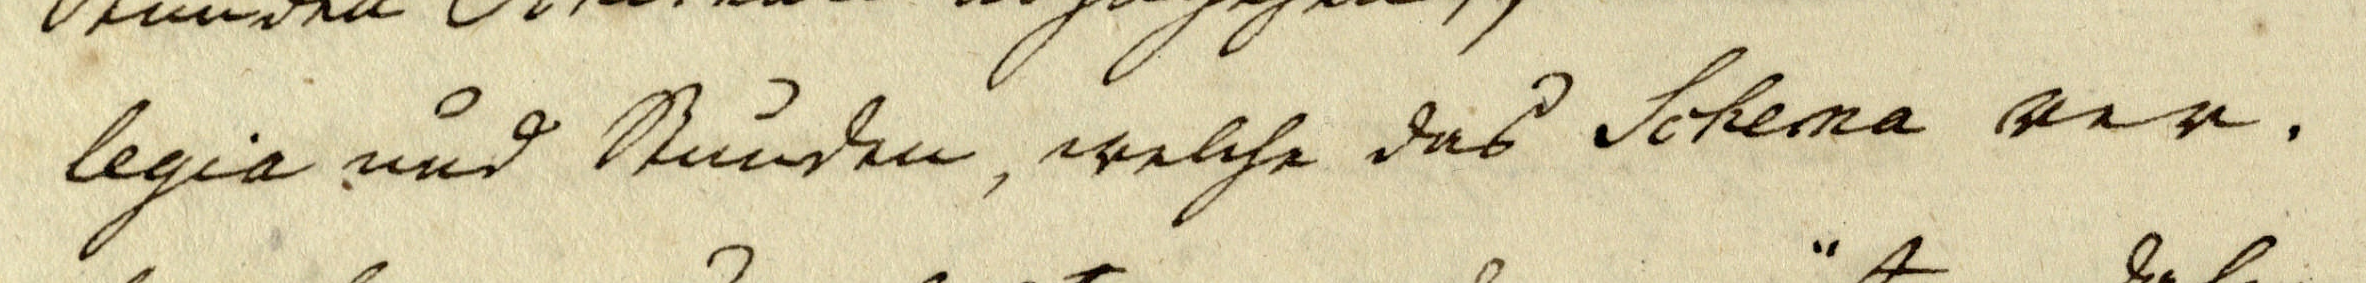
legia und Stunden, welche das Schema ver¬
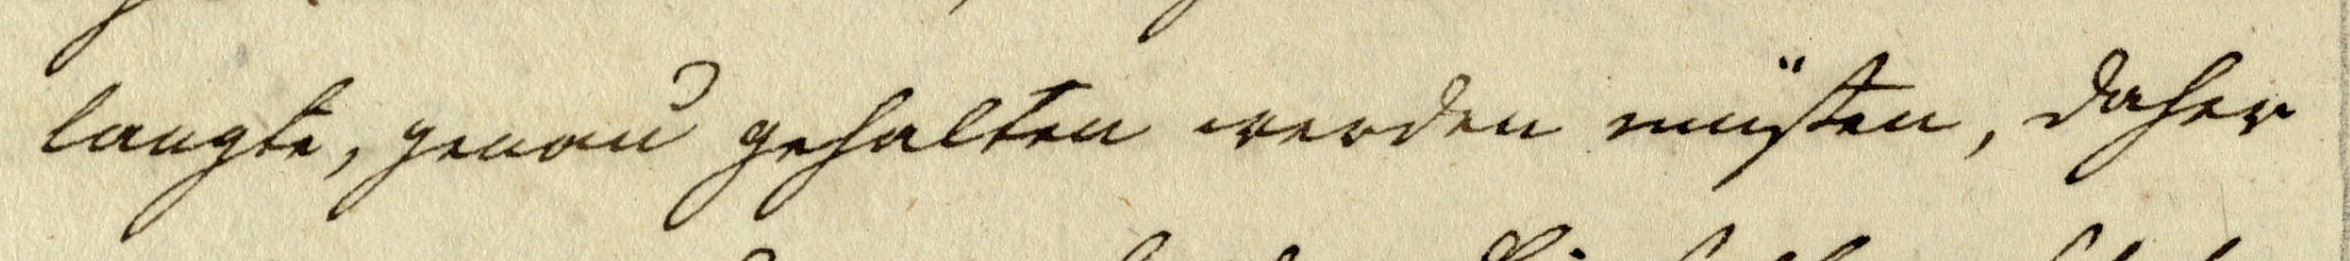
langte, genau gehalten werden müßten, daher
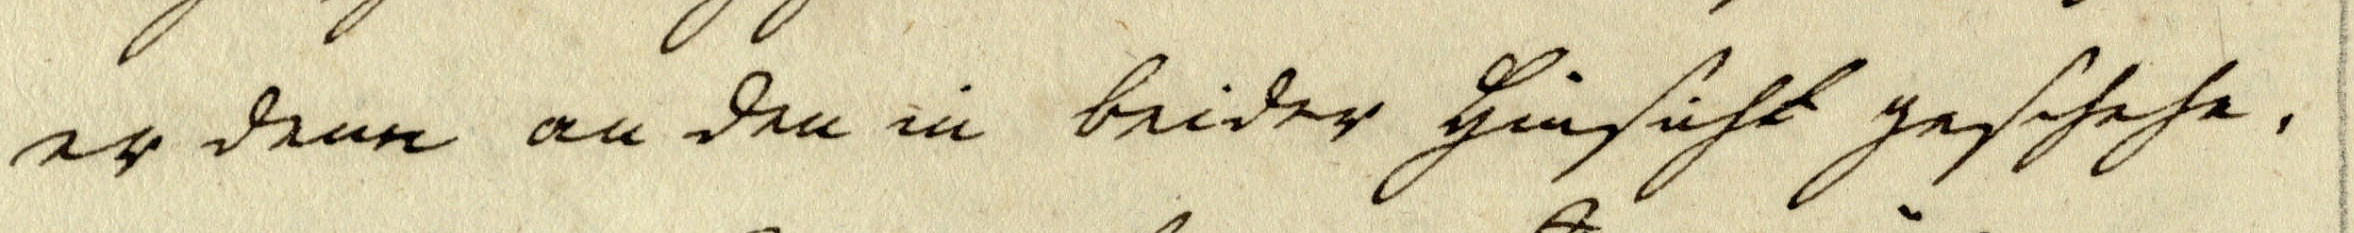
er denn an den in beider Hinsicht geschehe¬
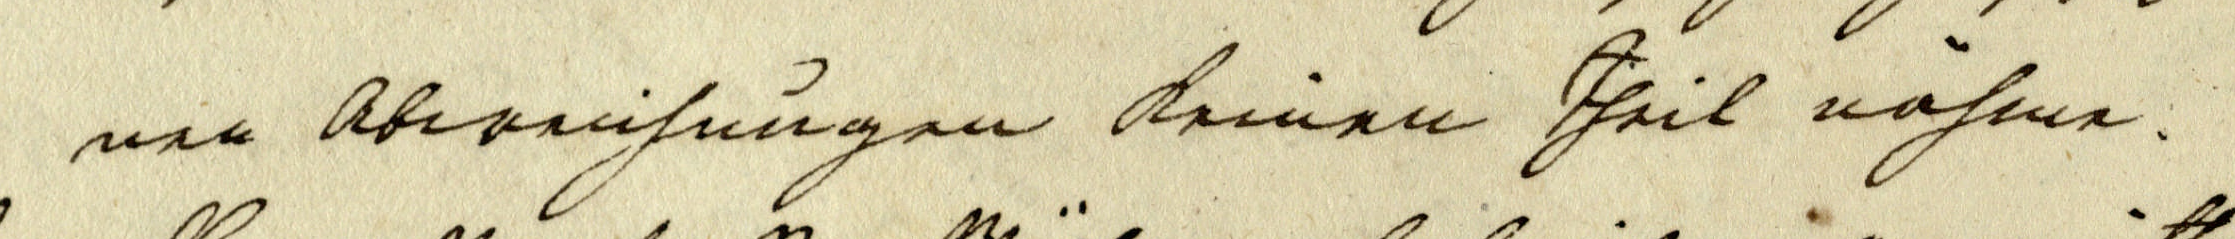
nen Abweichungen keinen Theil nähme.
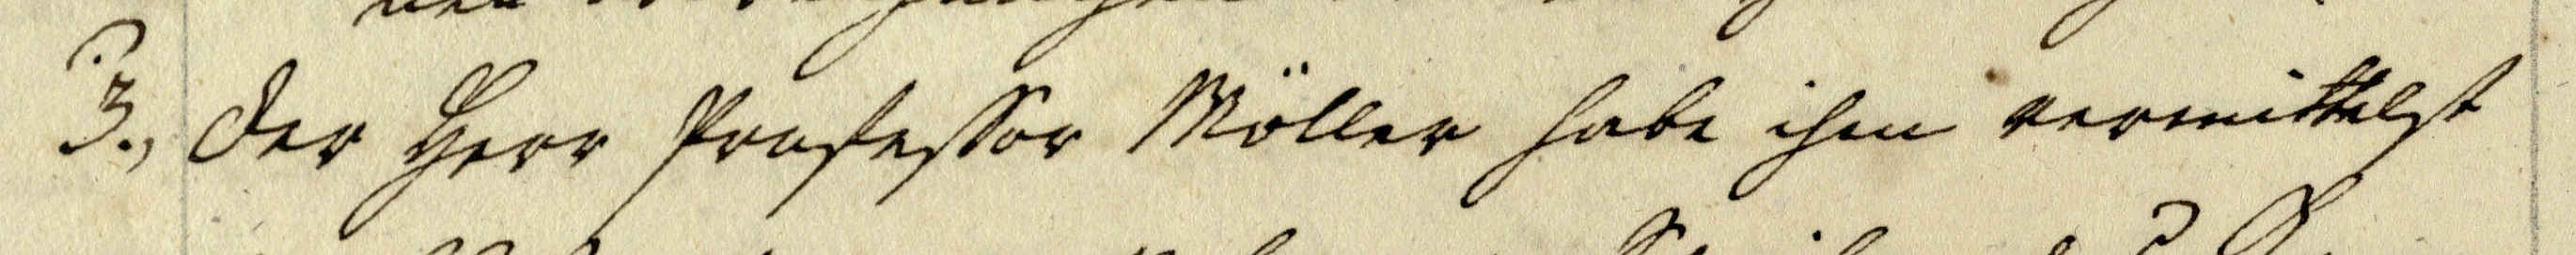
3., Der Herr Professor Möller habe ihm vermittelst
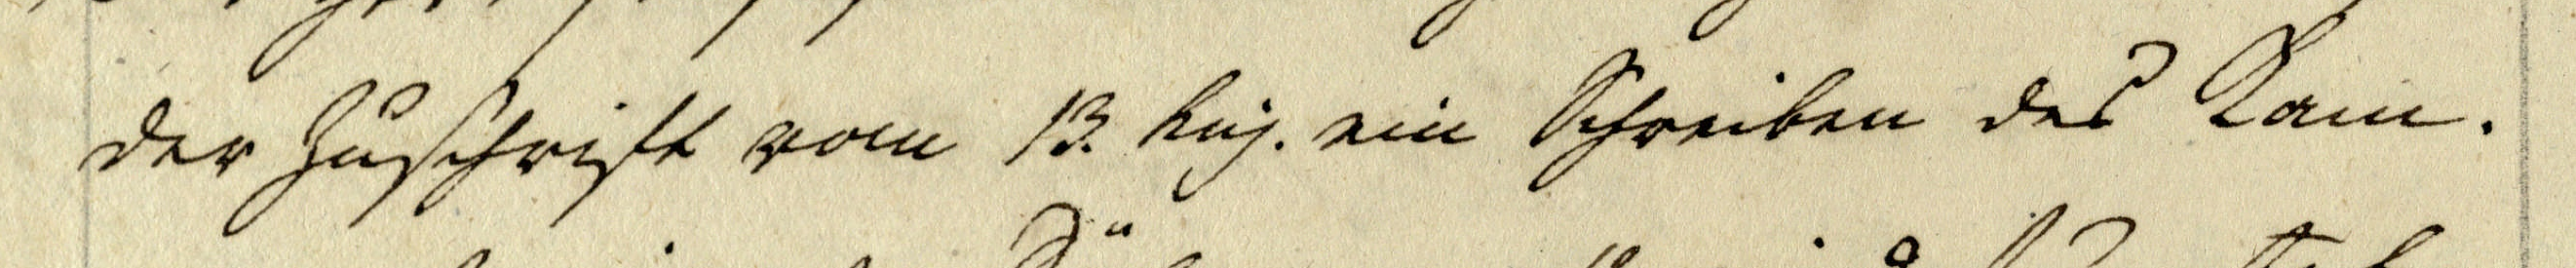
der Zuschrift vom 13. huj. ein Schreiben des Kam¬
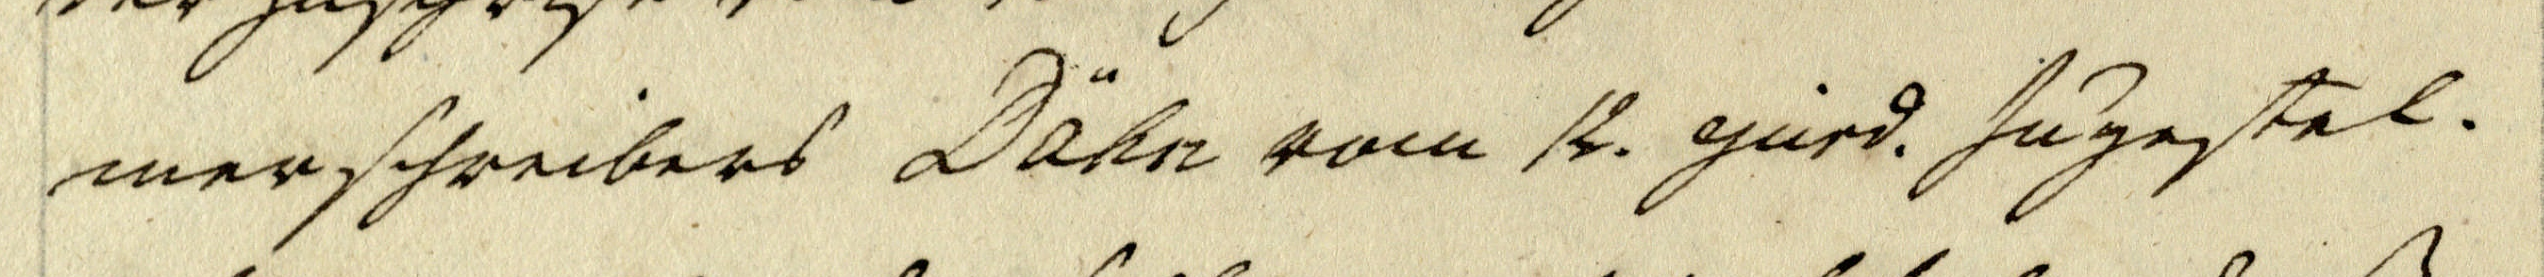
merschreibers Dähn vom 12. ejusd. zugestel¬
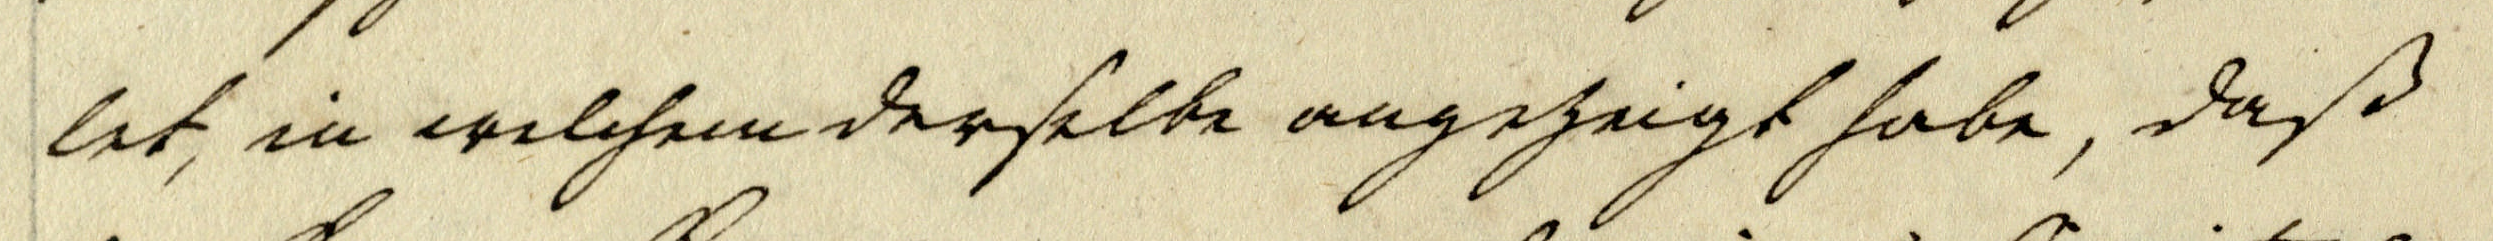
let, in welchem derselbe angezeigt habe, daß
